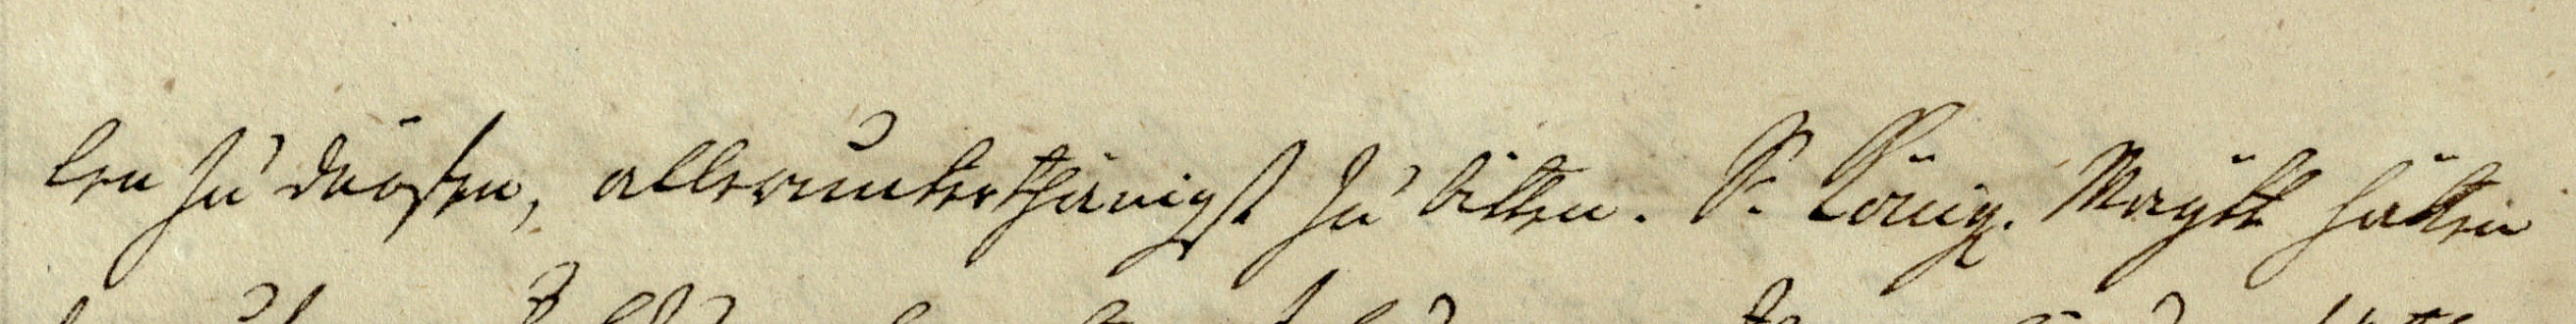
len zu dürfen, allerunterthänigst zu bitten. Sr König. Maÿtt. haben
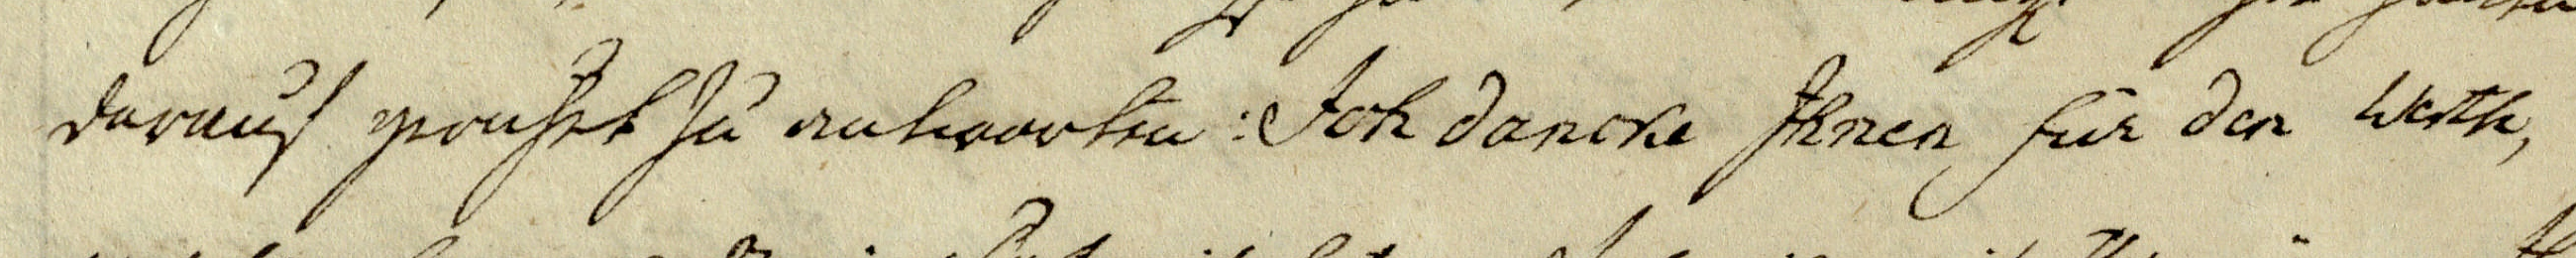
darauf geruhet zu antworten: Ich dancke Ihnen für den Werth,
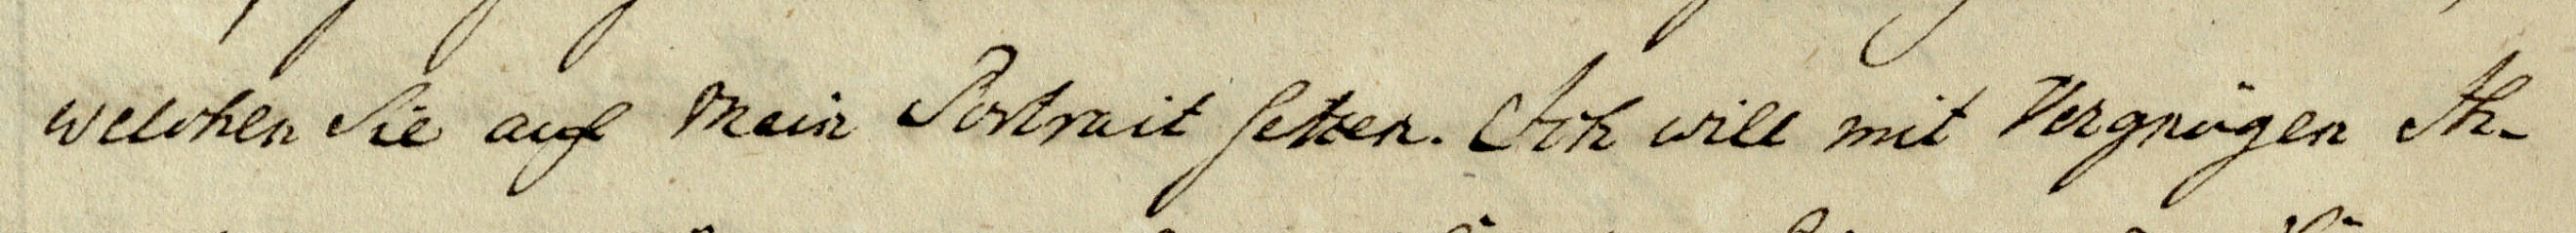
welchen Sie auf Mein Portrait setzen. Ich will mit Vergnügen Ih¬
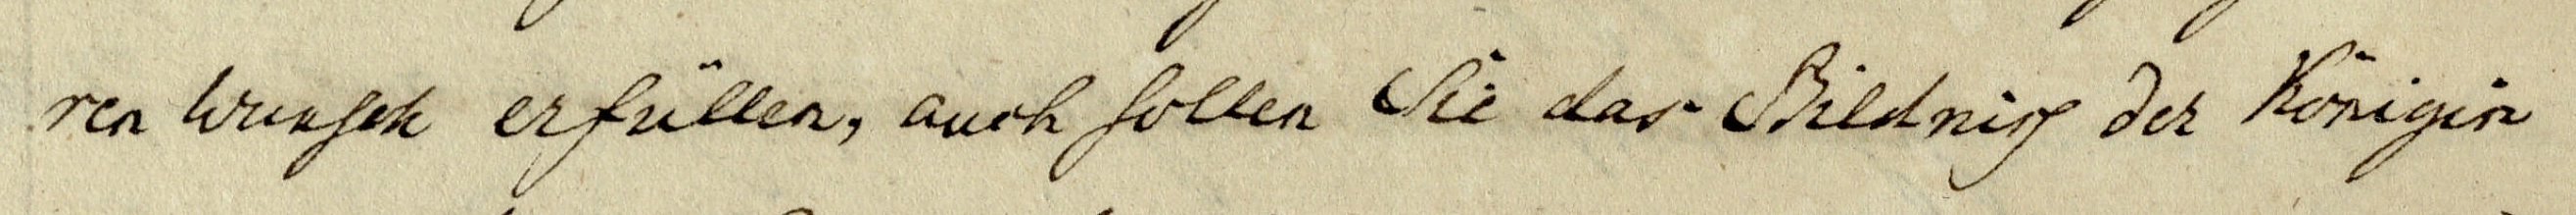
ren Wunsch erfüllen, auch sollen Sie das Bildniß der Königin
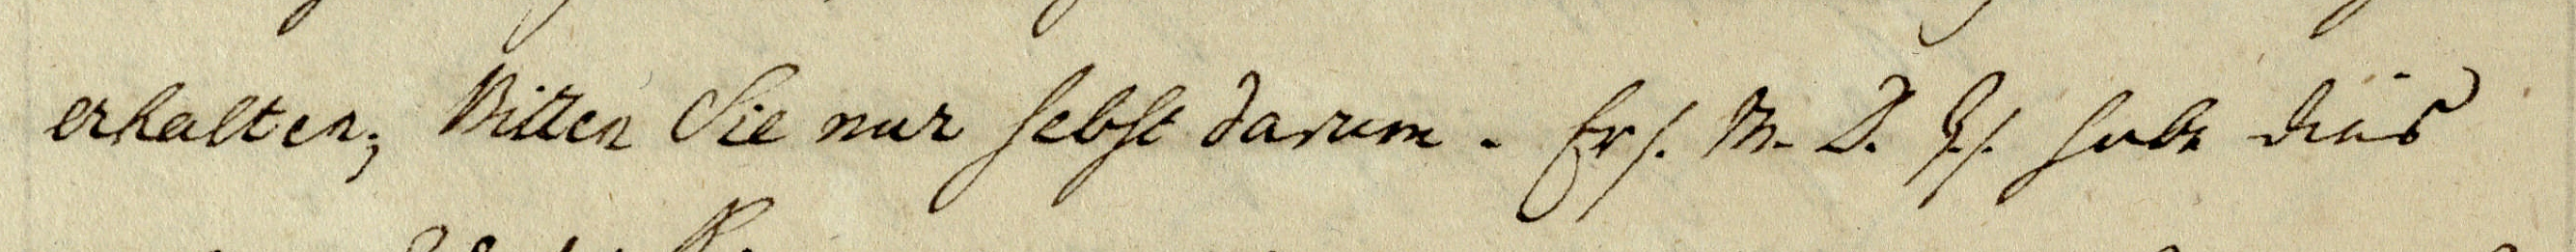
erhalten; Bitten Sie nur selbst darum. Er /. M. D. R./. habe dies
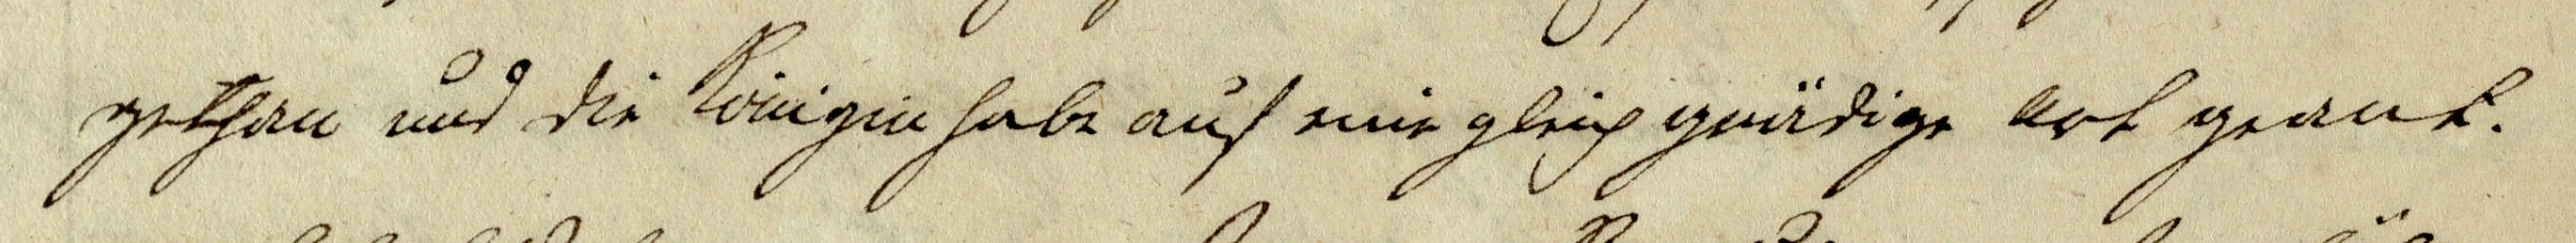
gethan und die Königin habe auf eine gleich gnädige Art geant¬
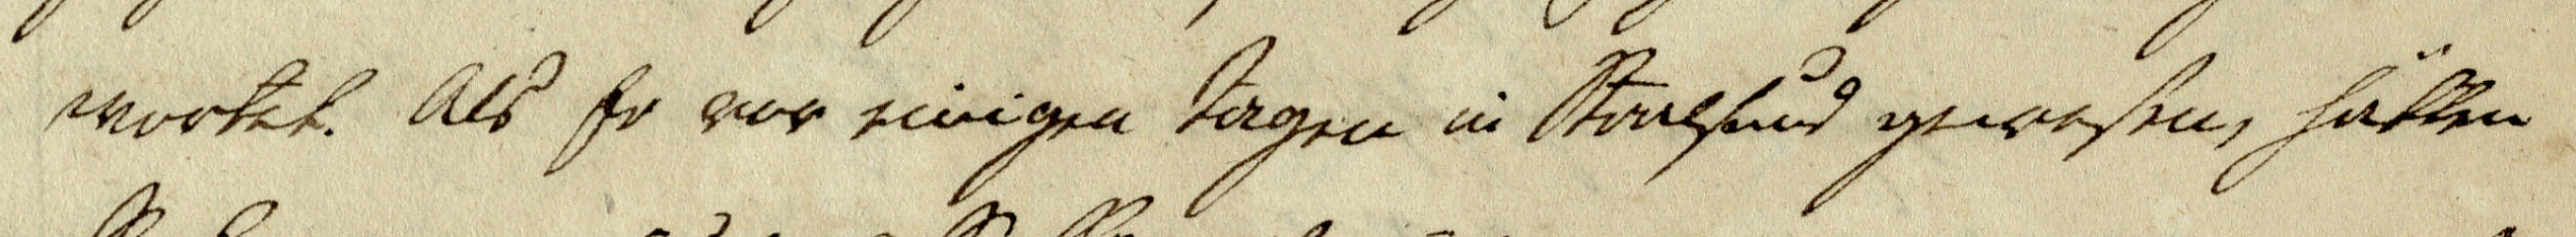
wortet. Als Er vor einigen Tagen in Stralsund gewesen, hätten
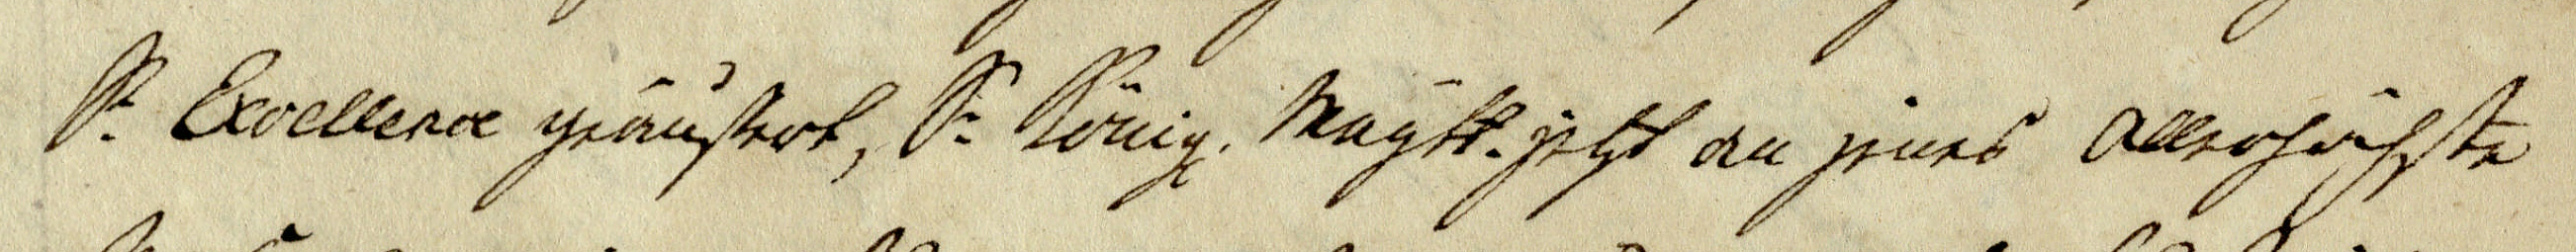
Sr. Excellence geäußert, Sr König. Maÿtt. jetzt an jenes Allerhöchste
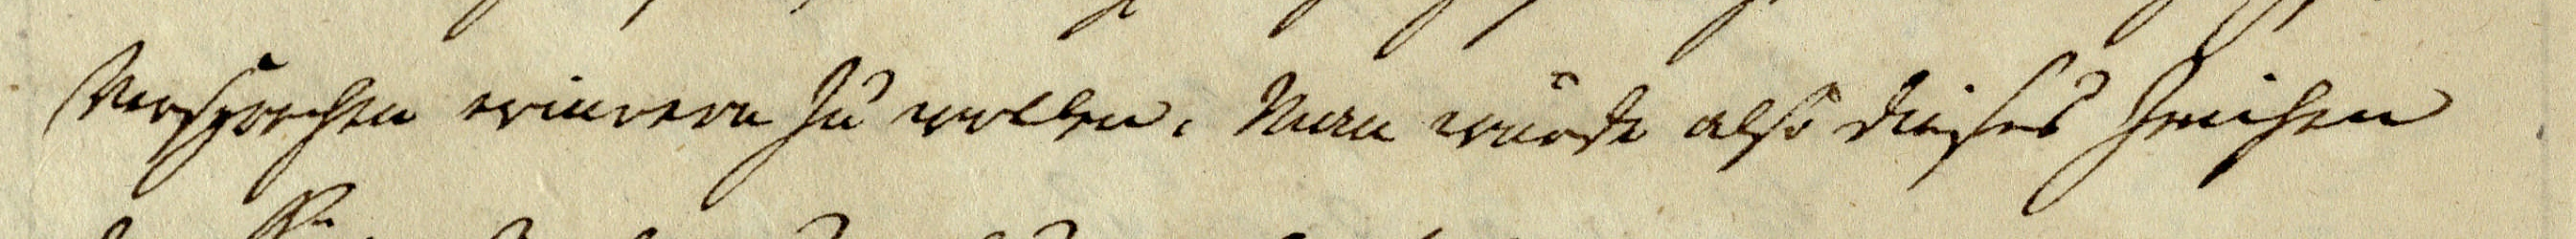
Versprechen erinnern zu wollen. Man würde also dieses Zeichen
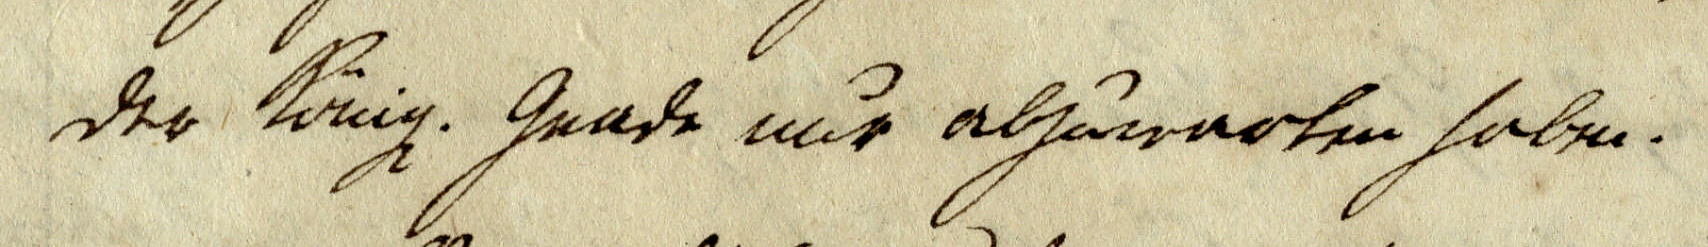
der Königl. Gnade nur abzuwarten haben.
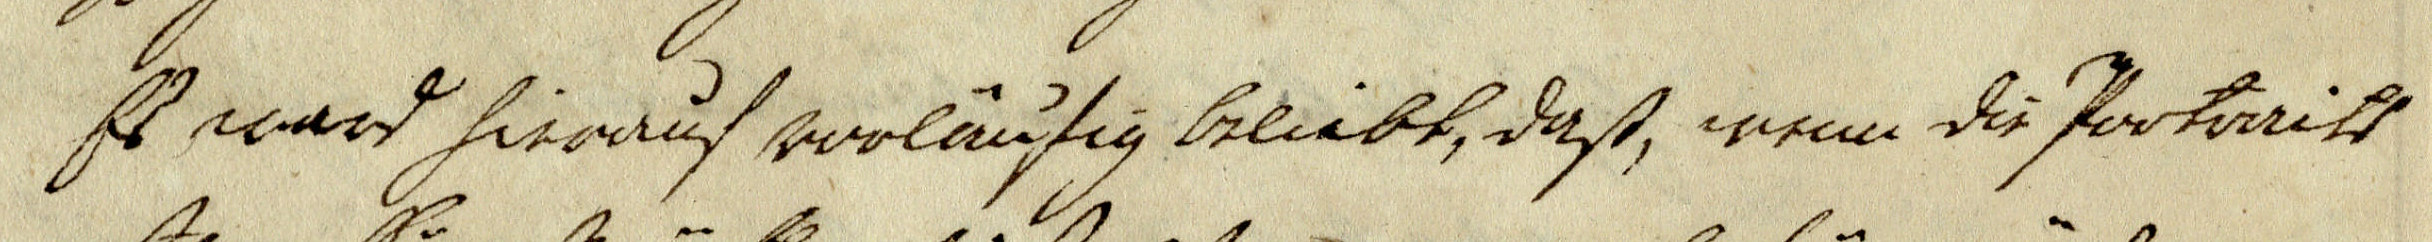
Es ward hierauf vorläufig beliebt, daß, wenn die Portraits
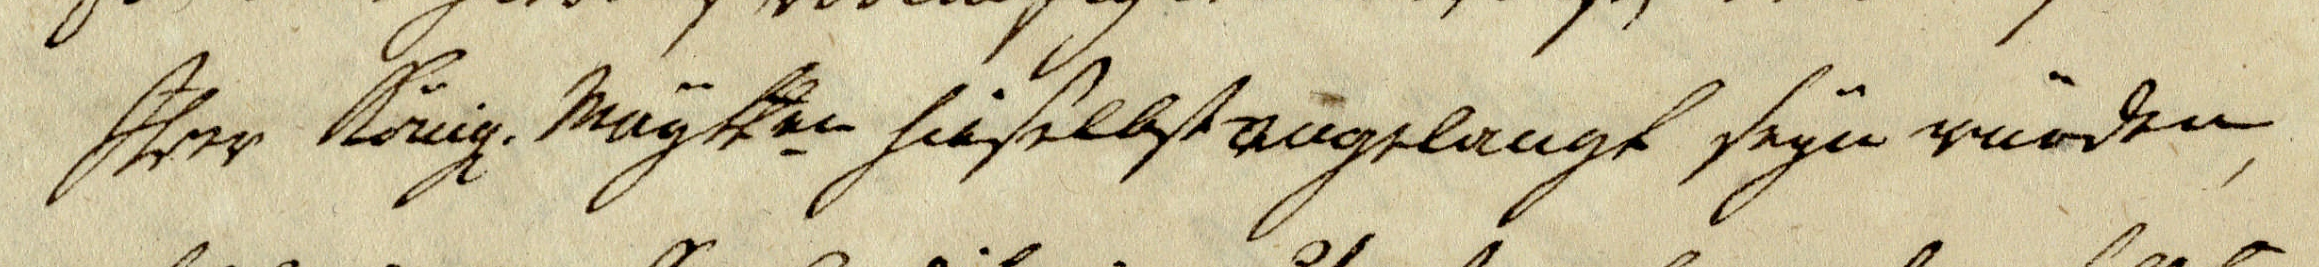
Ihrer König. Maÿtten hieselbst angelangt seÿn würden,
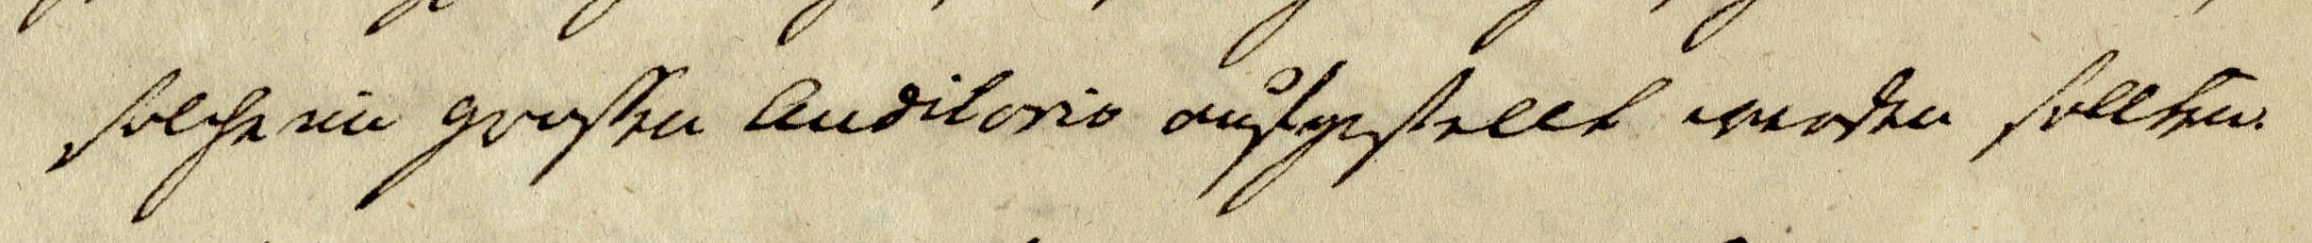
solche im grossen Auditorio aufgestellt werden sollten.
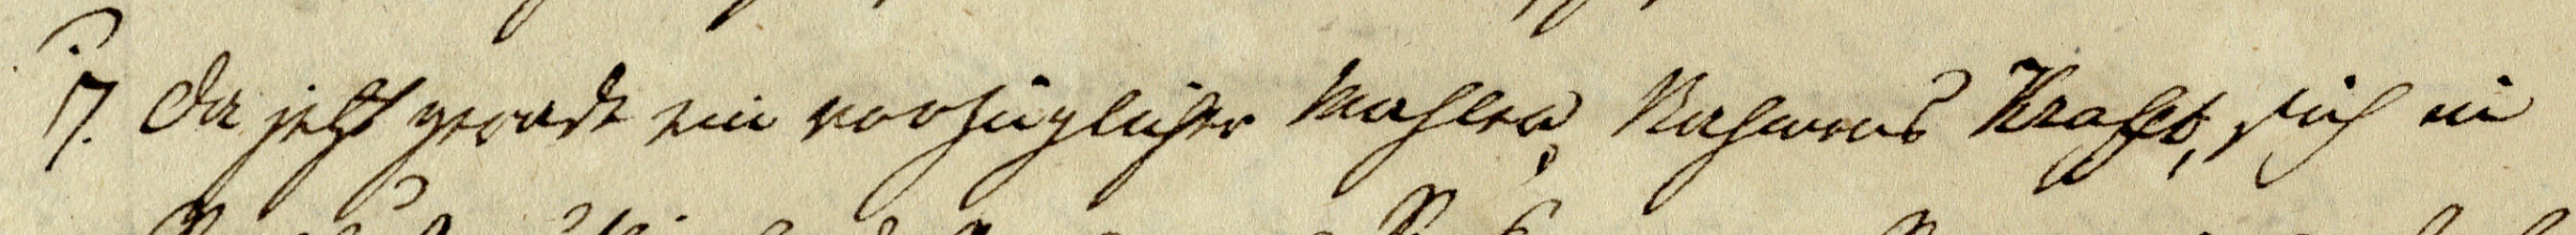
7. Da jetzt gerade ein vorzüglichen Mahler, Nahmens Krafft, sich in
